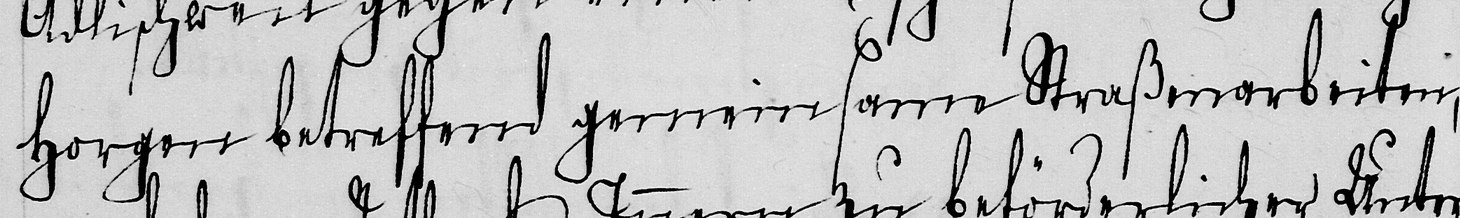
Horgen betreffend gemeinsame Straßenarbeiten,
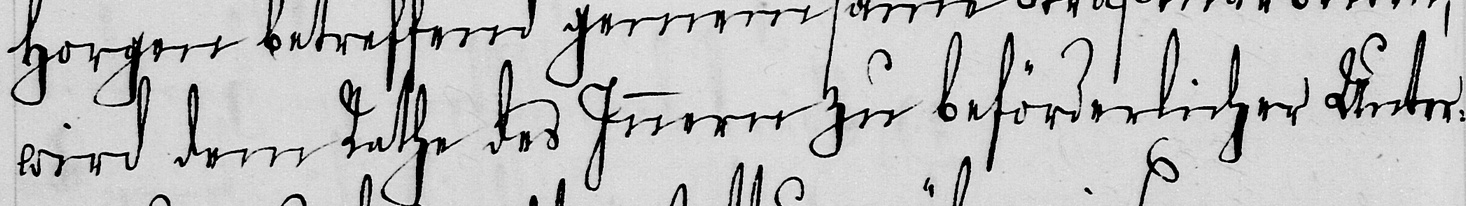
wird dem Rathe des Innern zu beförderlicher Unte¬
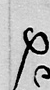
r¬
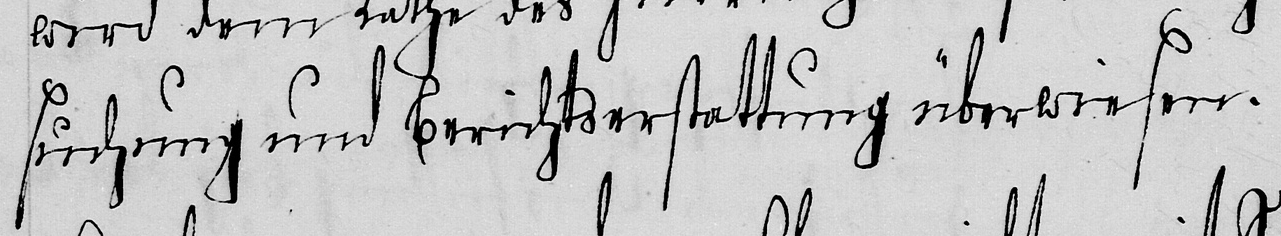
suchung und Berichtserstattung überwiesen.
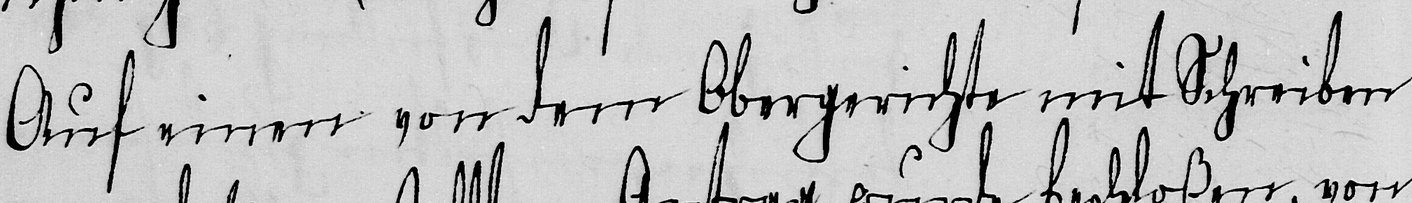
Auf einen von dem Obergerichte mit Schreiben
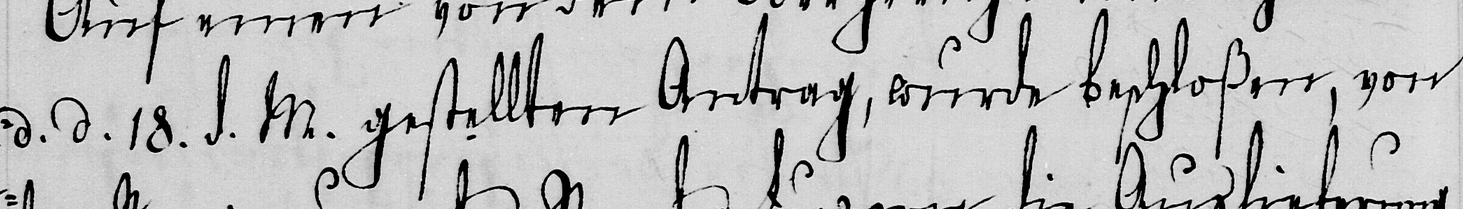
d. d. 18. d. M. gestellten Antrag, wurde beschloßen, von
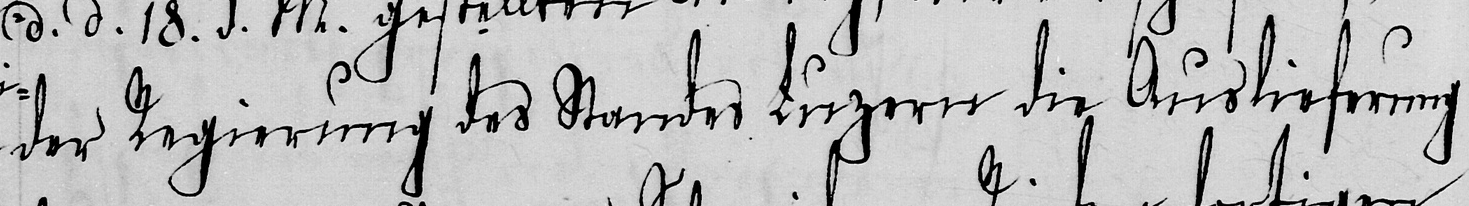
der Regierung des Standes Luzern die Auslieferung
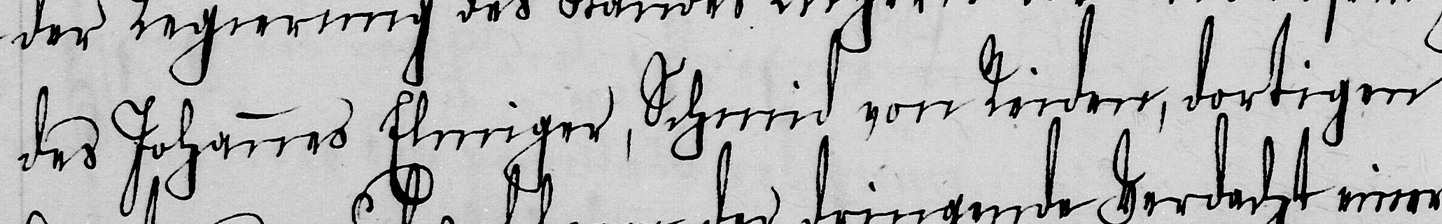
des Johannes Elmiger, Schmid von Reiden, dortigen
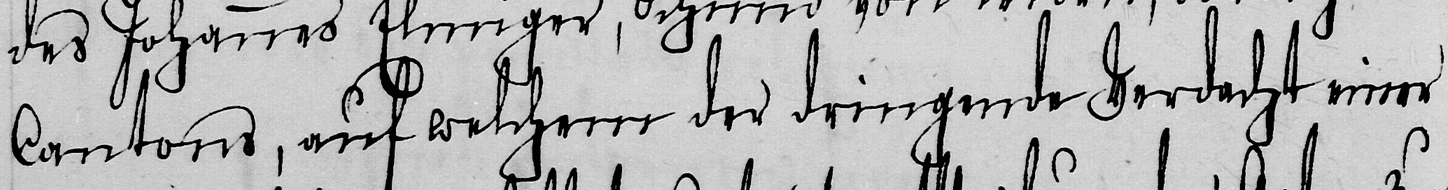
Cantons, auf welchem der dringende Verdacht einer
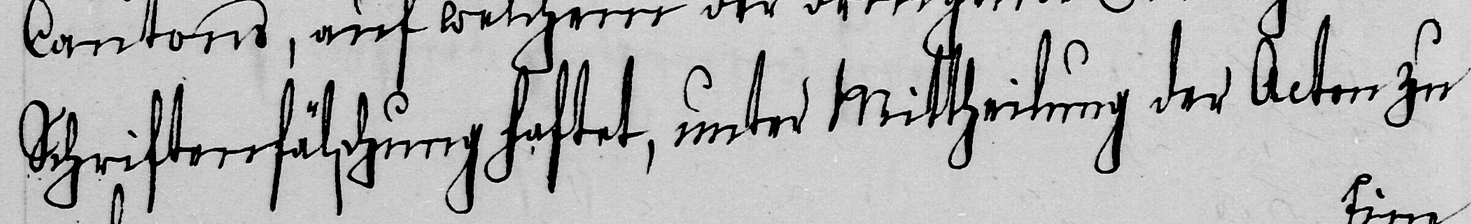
Schriftfälschung haftet, unter Mittheilung der Acten zu
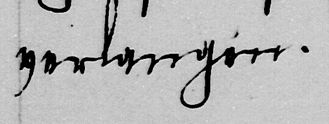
verlangen.
